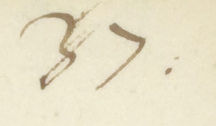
37.
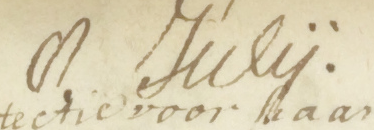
8 Julij.
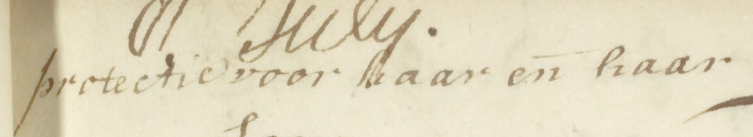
potectie voor haar en haar
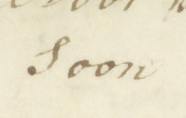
soon
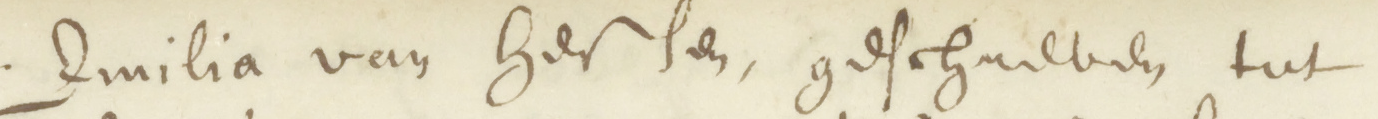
Emilia van Hessen, geschreven tot
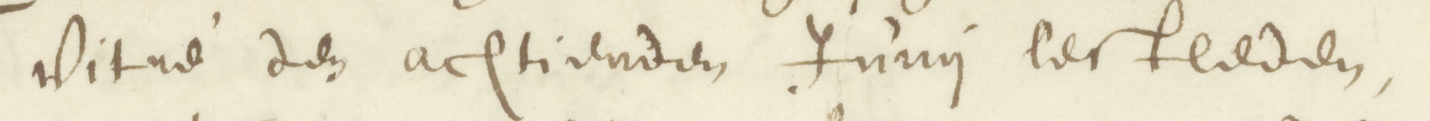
Vitré den achtienden Junij lestleden,
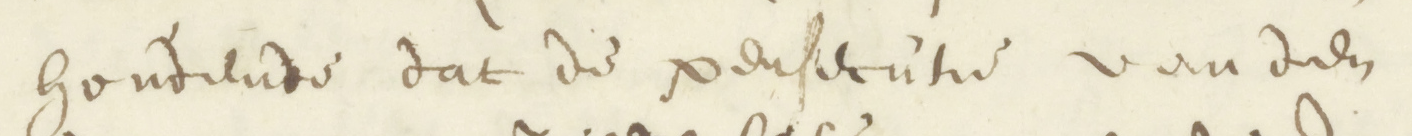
houdende dat de persecutie van den
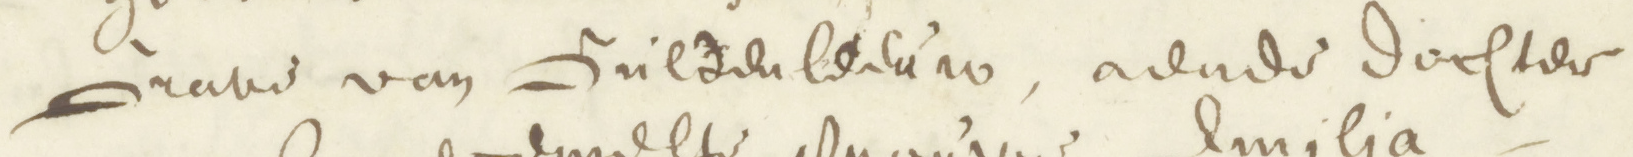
Grave van Guldenleeuw, aende Dochter
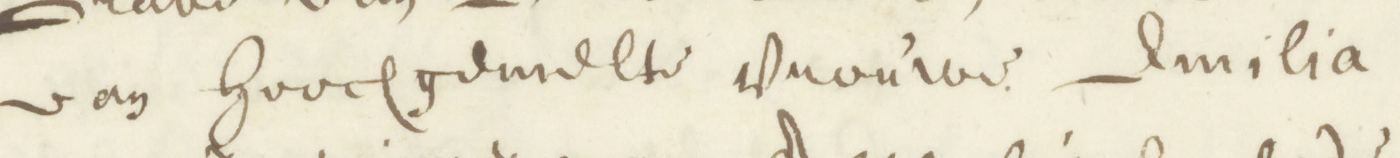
van hoochgemelte Vrouwe Emilia
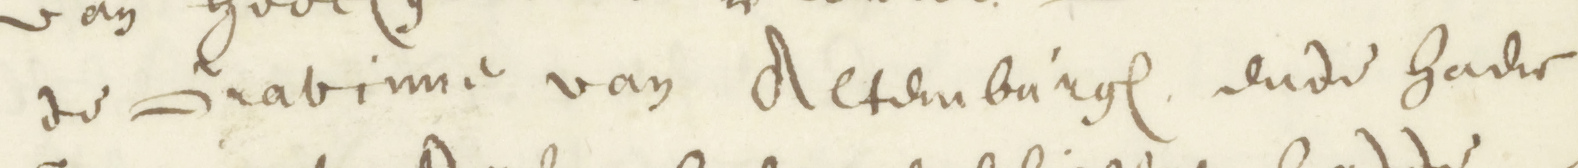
de Gravinne van Altenburgh, ende haer
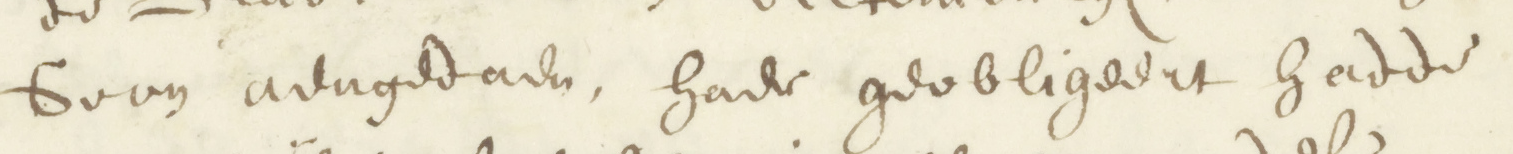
Soon aengedaen, haer geobligeert hadde
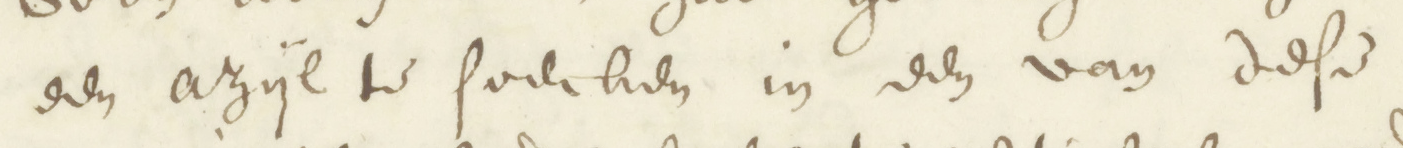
een azijl te soecken in een van dese
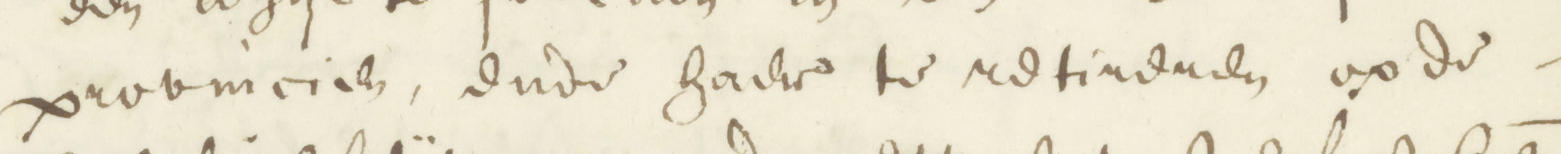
provincien, ende haer te retireren op de
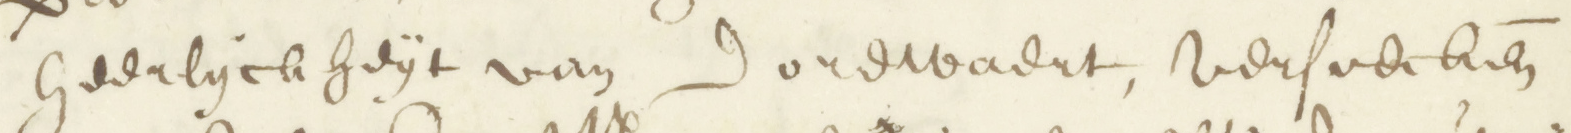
heerlijckheijt van Dorewaert, versoecken
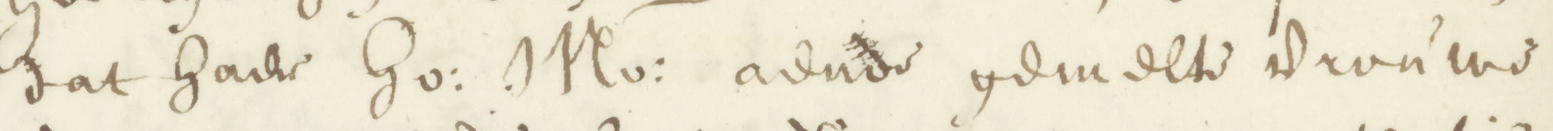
dat haer ho:Mo: aende gemelte Vrouwe
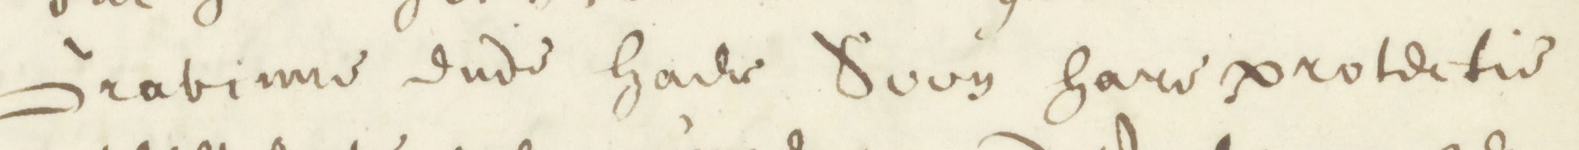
Gravinne ende haer Soon hare protectie
